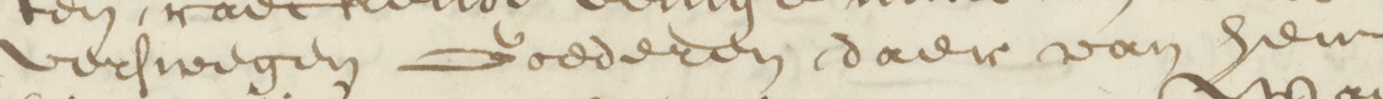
verswegen Goederen, daer van hem
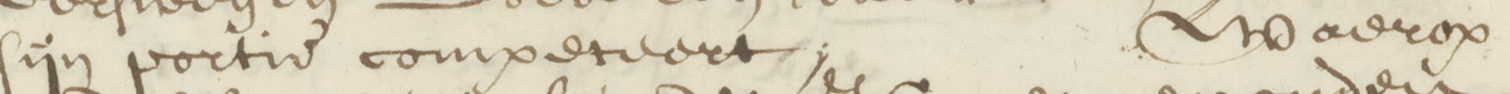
sijn portie competeert; Waerop
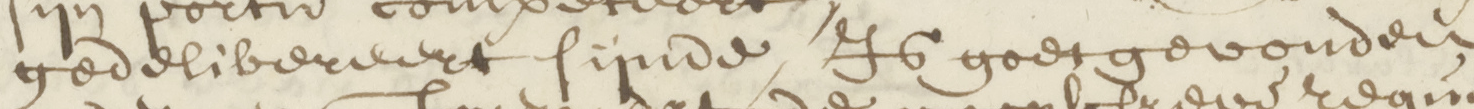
gedelibereert sijnde, Is goetgevonden
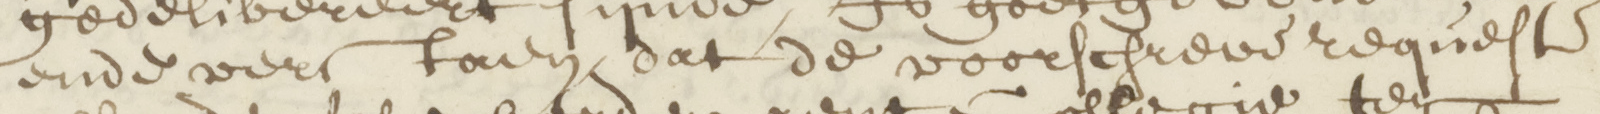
ende veerstaen, dat de voorschreve requeste
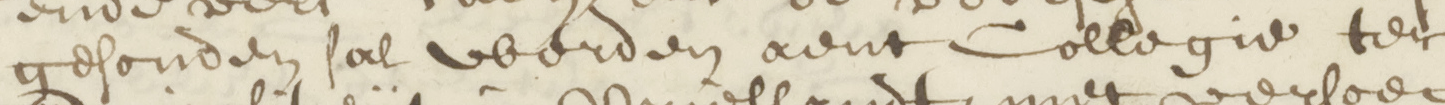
gesonden sal werden aent Collegie ter
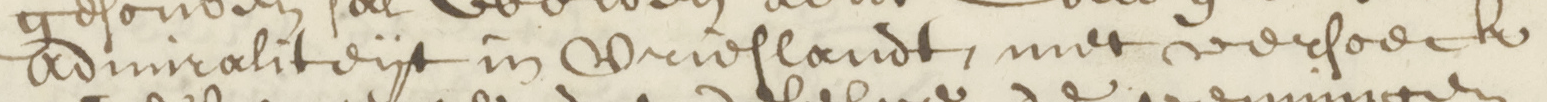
Admiraliteijt in Vrieslandt, met versoeck
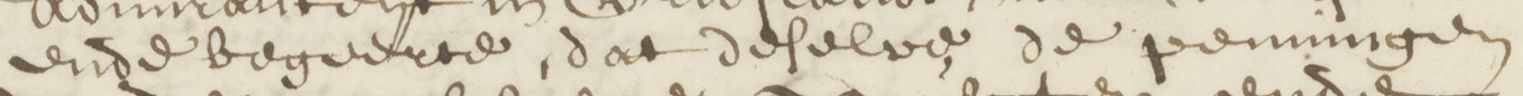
ende begeerte, dat deselve de penningen
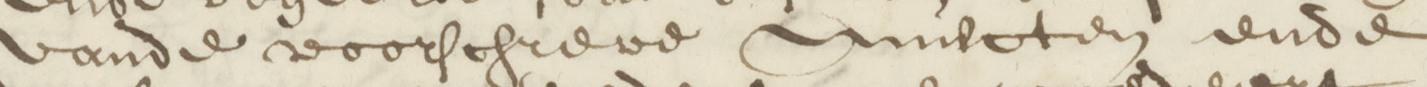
vande voorschreve Mulcten ende
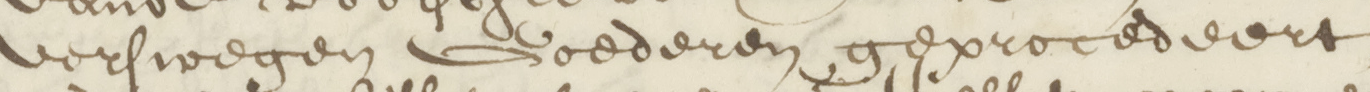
verswegen Goederen geprocedeert,
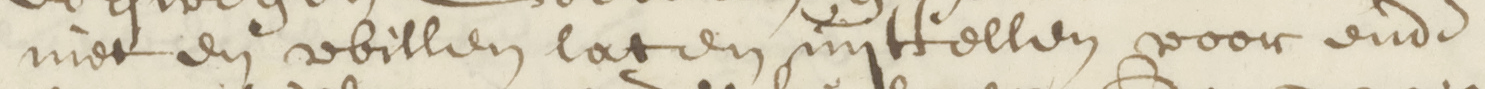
niet en willen laten uijttellen voor ende
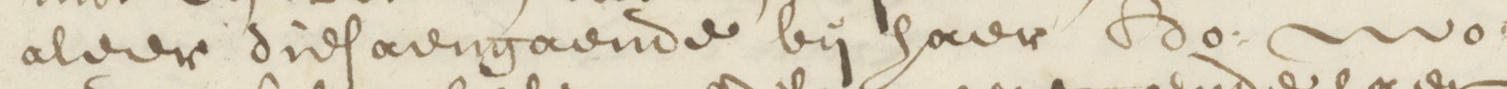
aleer diesaengaende bij haer Ho:Mo:
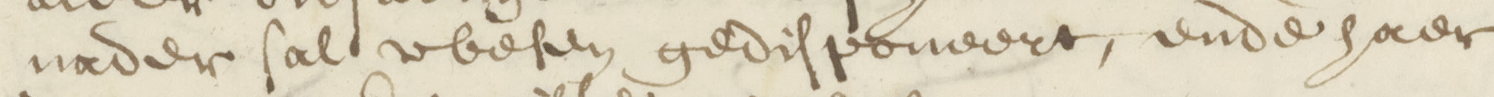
nader sal wesen gedisponeert, ende haer
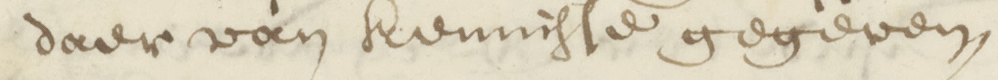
daer van kennisse gegeven.
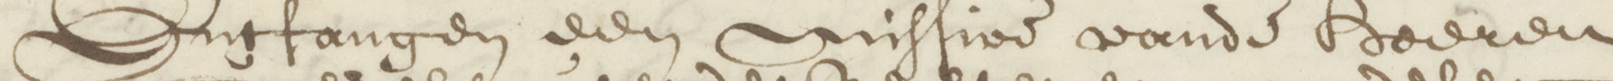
Ontfangen een Missive vande Heeren
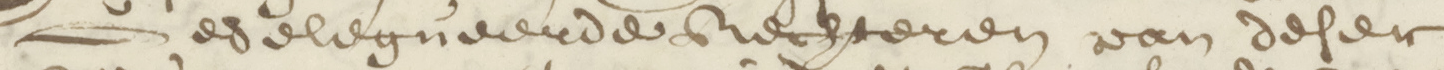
Gedeputeerde Rechteren van desen
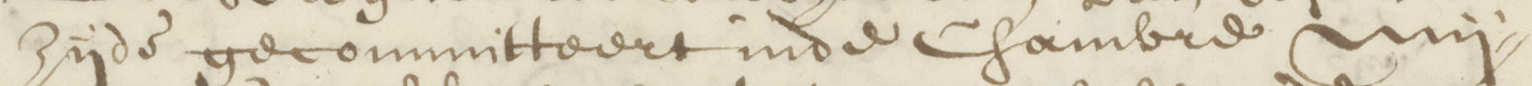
zijde gecommitteert inde Chambre Mij„
